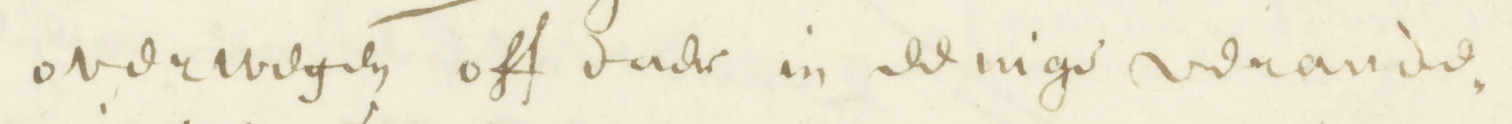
overwegen off daer in eenige verande„
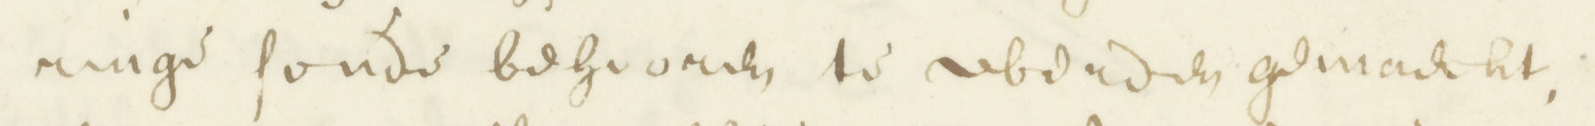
ringe soude behooren te werden gemaeckt,
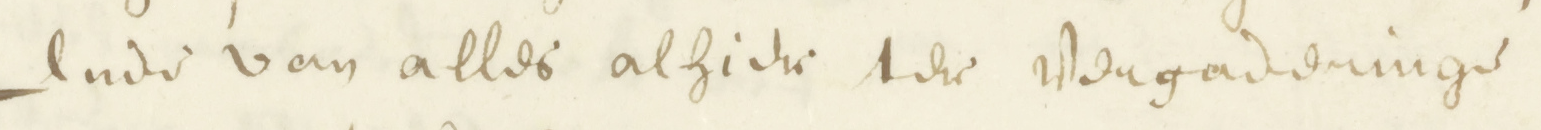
ende van alles alhier ter Vergaderinge
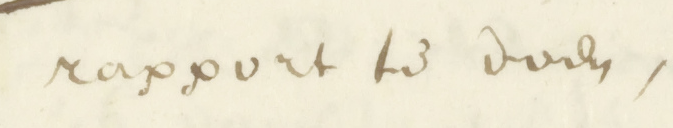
rapport te doen.
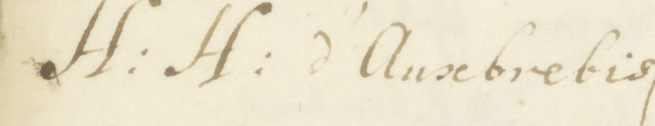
H:H: d'Auxbrebis
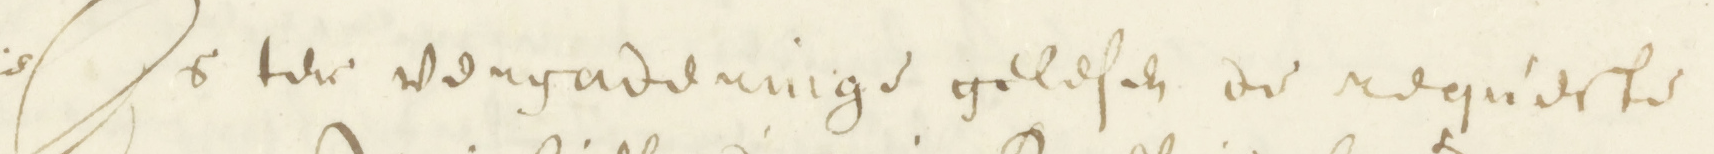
Is ter vergaderinge gelesen de requeste
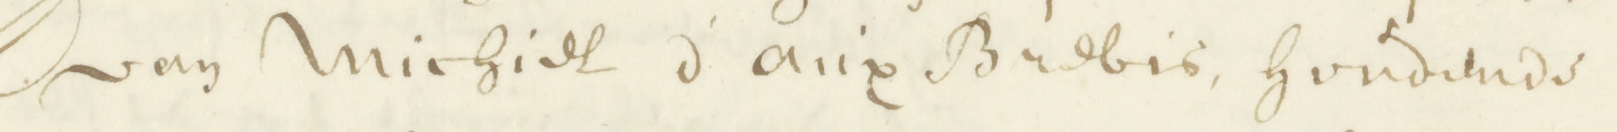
van Michiel d'aux Brebis, houdende
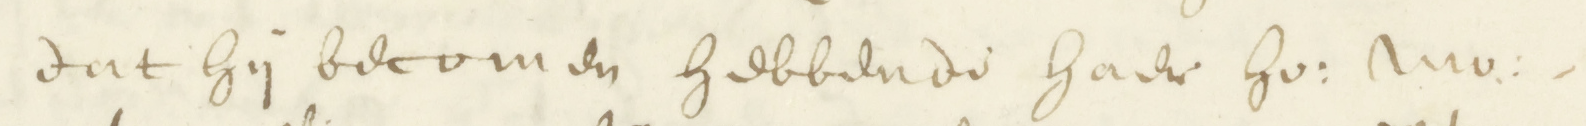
dat hij becomen hebbende haer ho:mo:
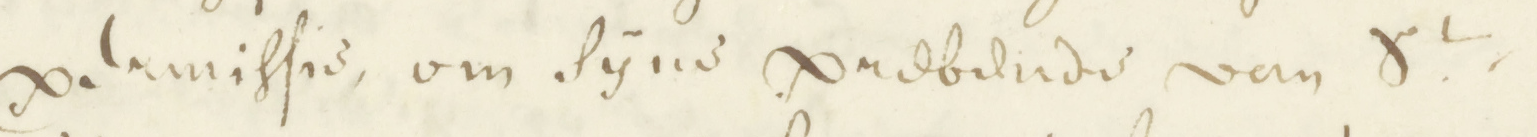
permissie, om sijne prebende van St.
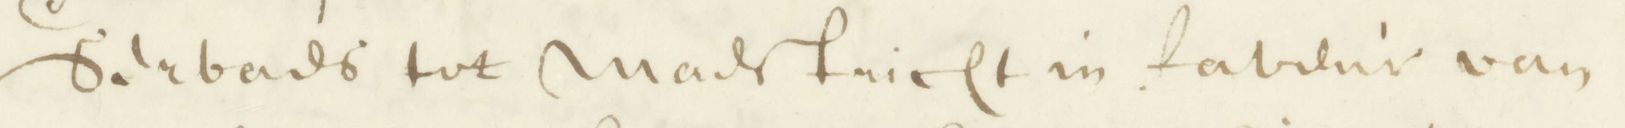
Servaes tot Maestricht in faveur van
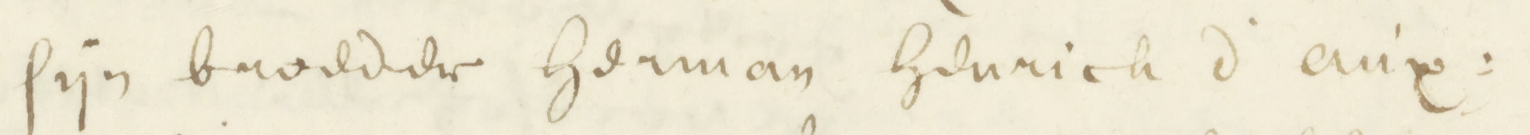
sijn broeder herman henrick d'aux:
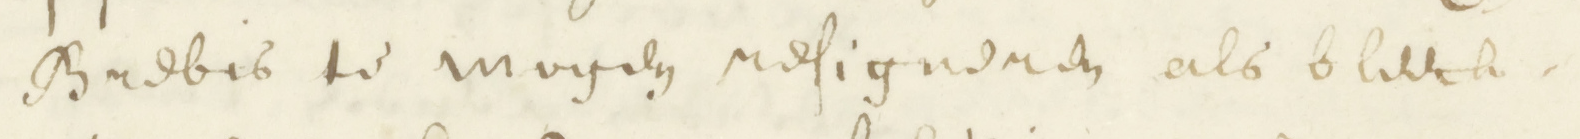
Brebis te mogen resigneren als bleeck
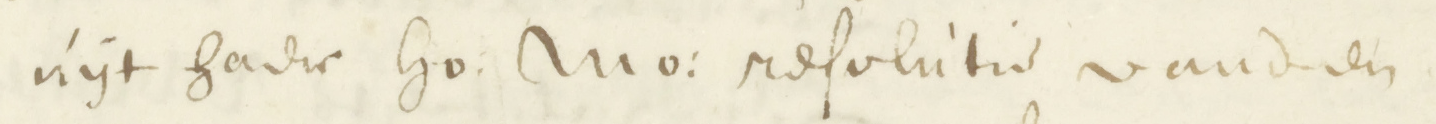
uijt haer ho:Mo: resolutie vanden
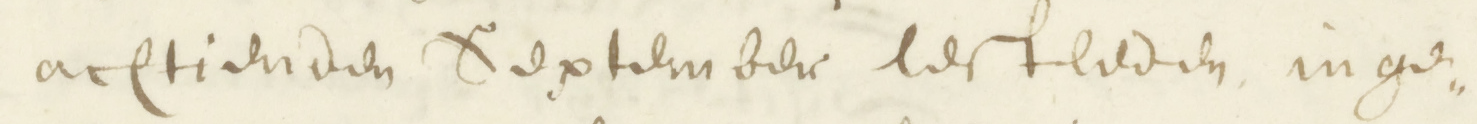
achtienden September lestleden, inge„
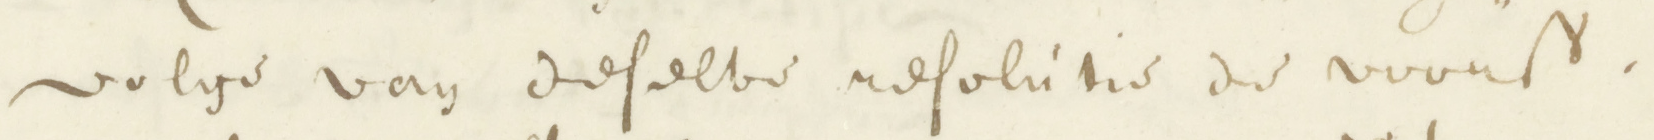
volge van deselve resolutie de voorsz
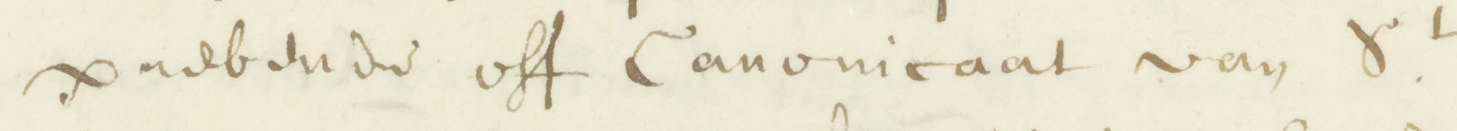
prebende off Canonicaat van St.
